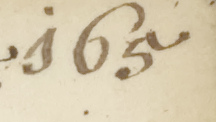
165
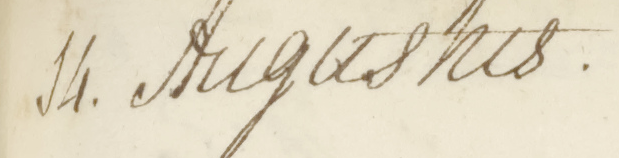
14. Augustus.
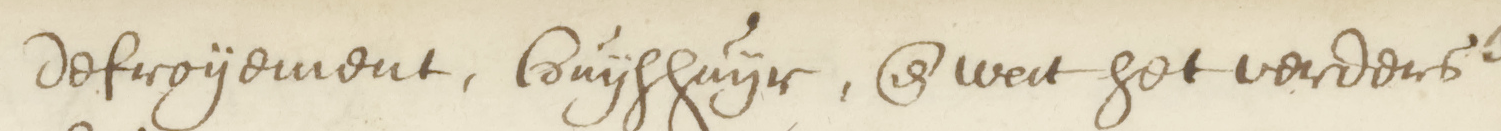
defroijement, huijshuijr, & wat het verders
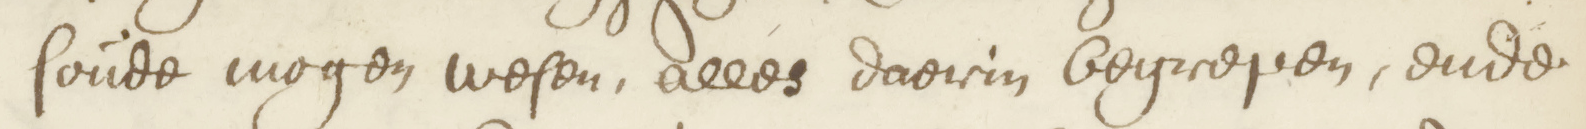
soude mogen wesen, alles daerin begrepen, ende
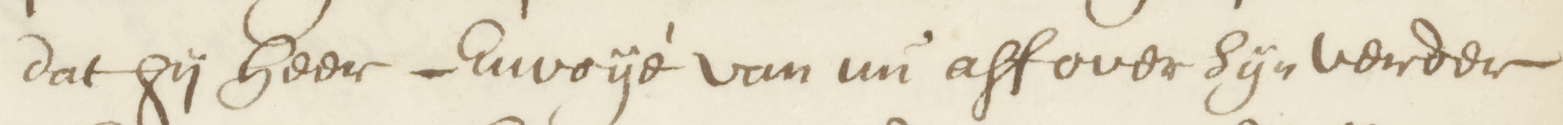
dat hij heer Envoijé van nu affover sijn verder
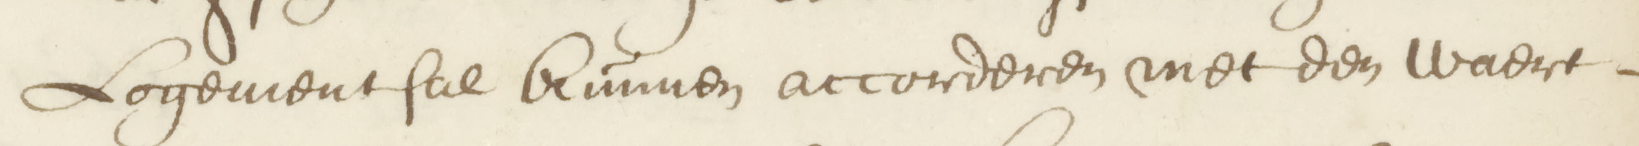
Logement sal kunnen accorderen met den waert
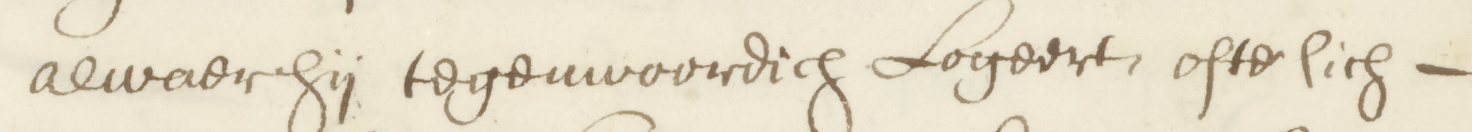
alwaer hij tegenwoordich Logeert, ofte sich
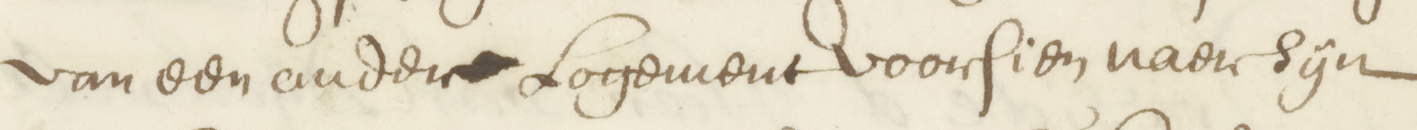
van een ander Logement voorsien naer sijn
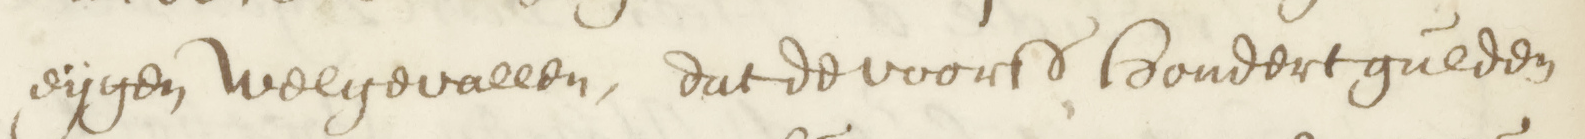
eijgen welgevallen, dat de voors hondert gulden
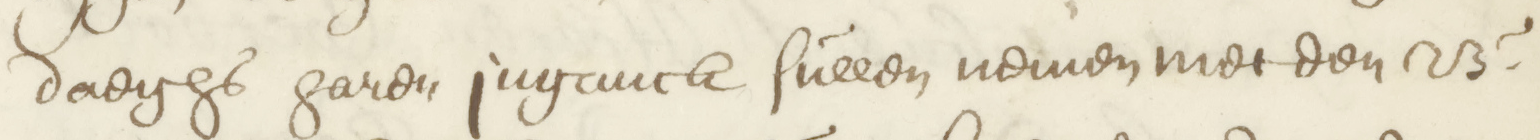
daeghs haren inganck sullen nemen met den 23e.
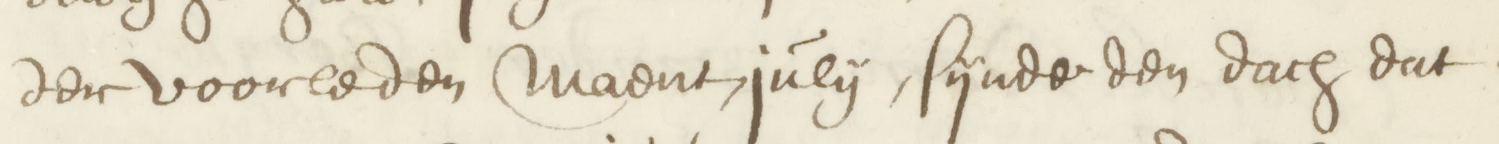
der voorleden maent, Julij, sijnde den dach dat
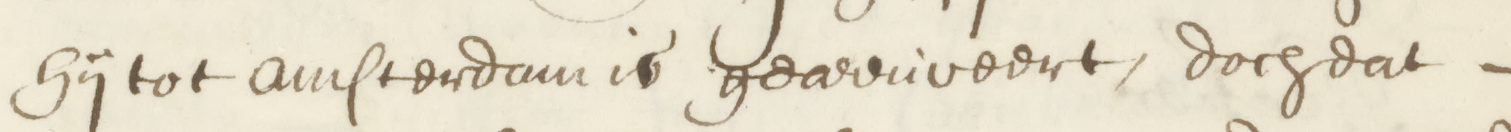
hij tot Amsterdam is gearriveert, doch dat
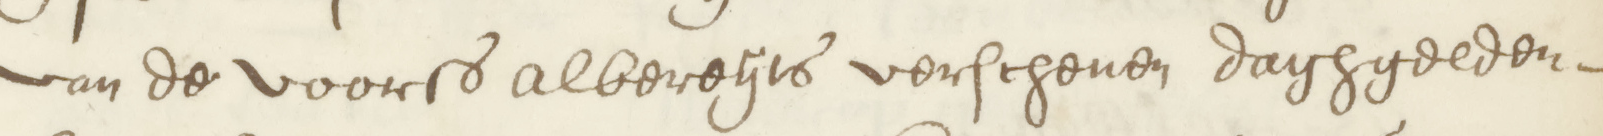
van de voors alberejts verschenen daghgelden
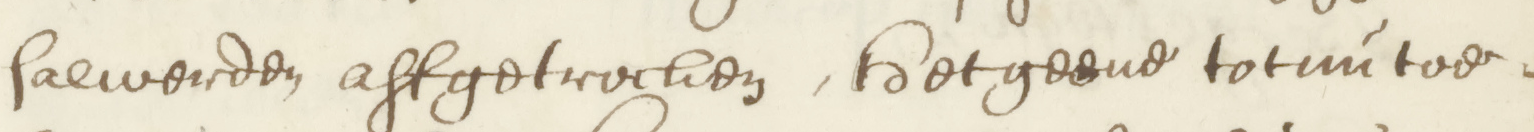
sal werden affgetrocken, het geene tot nu toe
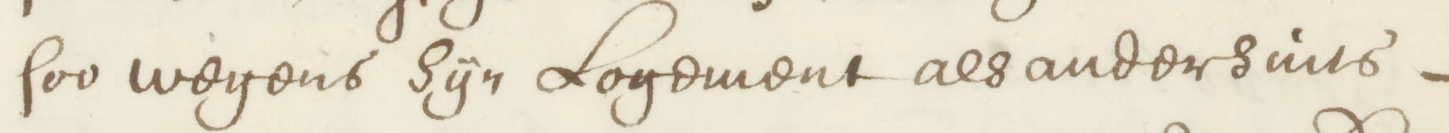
soo wegens sijn Logement als andersints
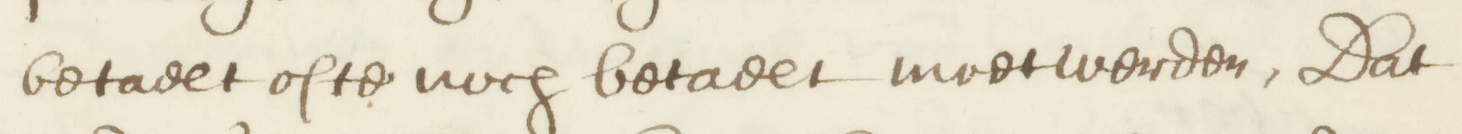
betaelt ofte noch betaelt moet werden. Dat
